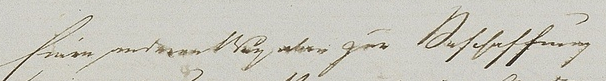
Einen anderen Weg aber zur Beschaffung
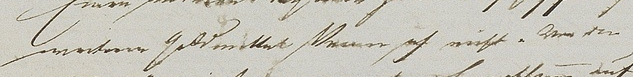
weiterer Geldmittel kenne ich nicht. Von den
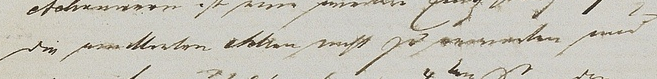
die emittirten Actien nicht zu erwarten und
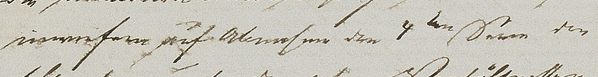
inwiefern auf Abnahme der 4ten Serie der
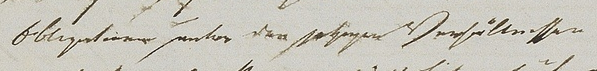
Obligationen unter den jetzigen Verhältnissen
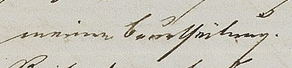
meiner Beurtheilung.
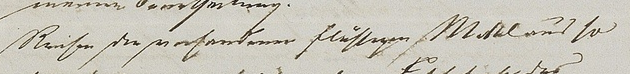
Reichen die vorhandenen flüssigen Mittel aus so
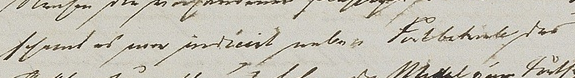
scheint es mir indicirt neben Fortbetrieb des
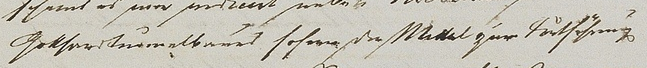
Gotthardtunnelbaues sofern die Mittel zur Fortführung
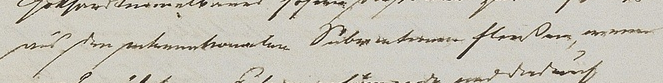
aus den internationalen Subventionen fließen, wenn
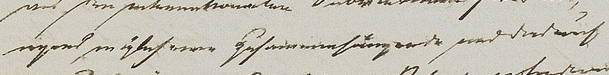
irgend möglich eine zusammenhängende und dadurch
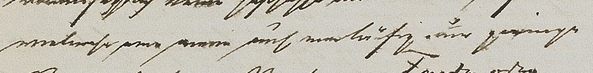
vielmehr eine wenn auch vorläufig nur geringe
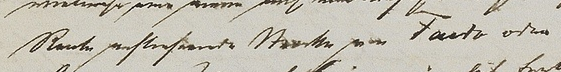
Rente versprechende Strecke von Faido oder
